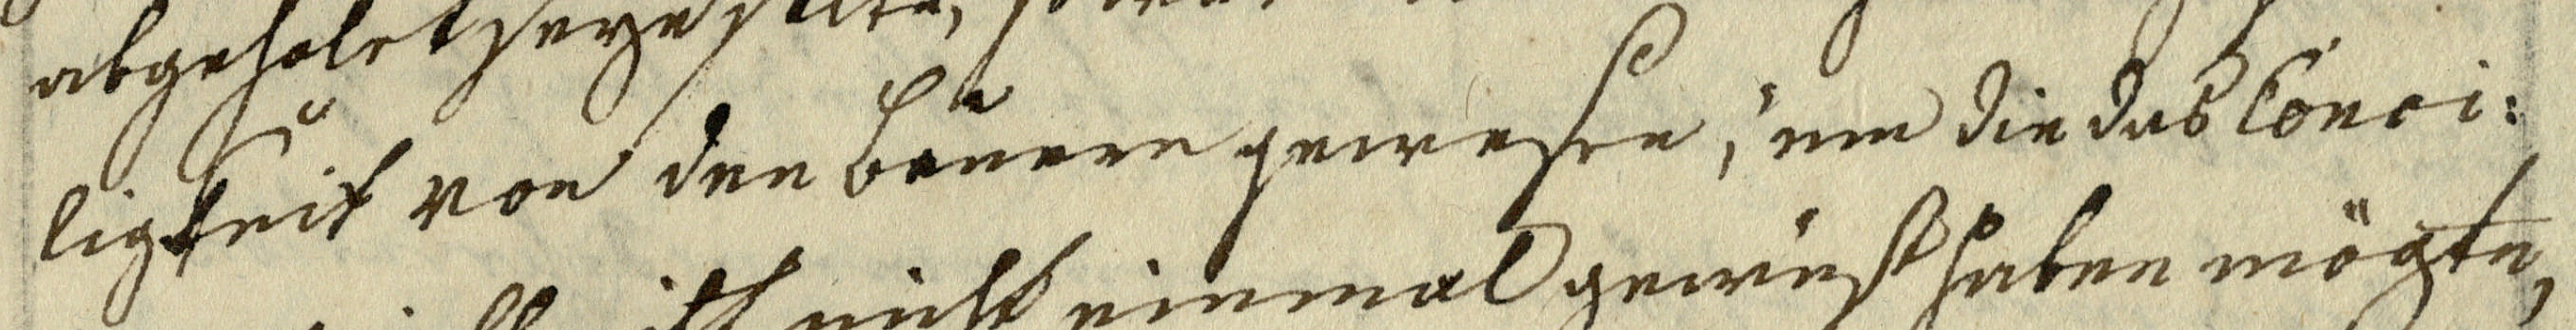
ligkeit von den Bauern gewesen, um die das Conci¬
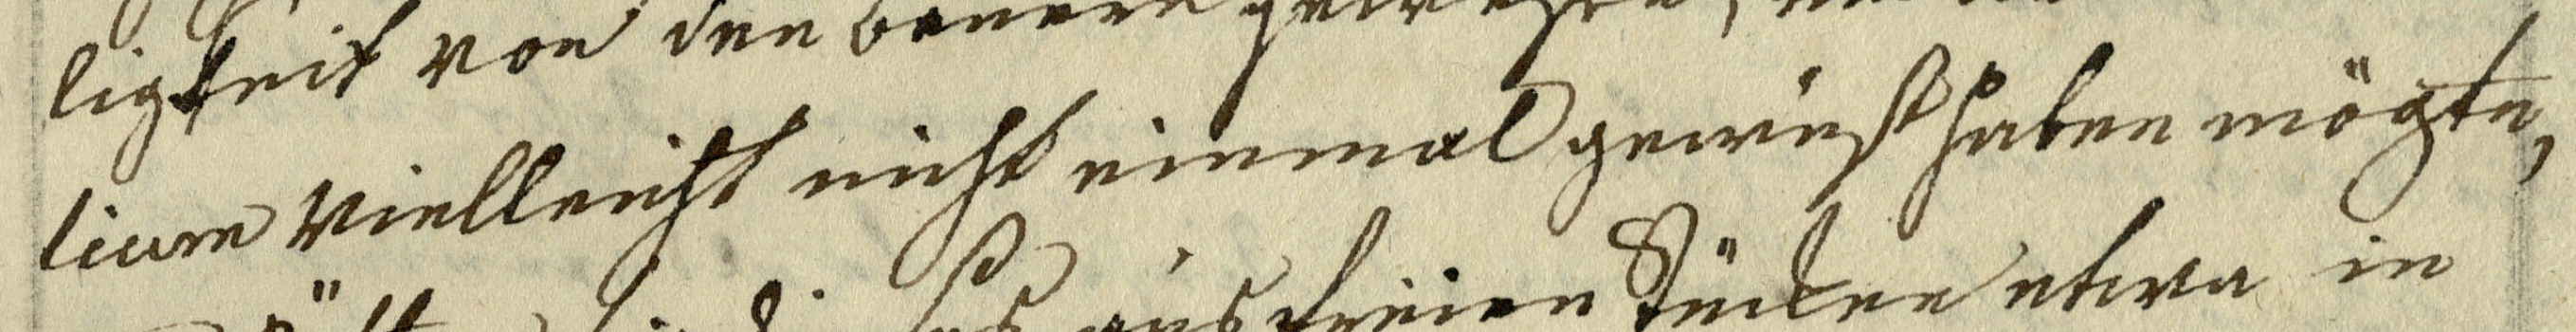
lium vielleicht nicht einmal gewußt haben mögte,
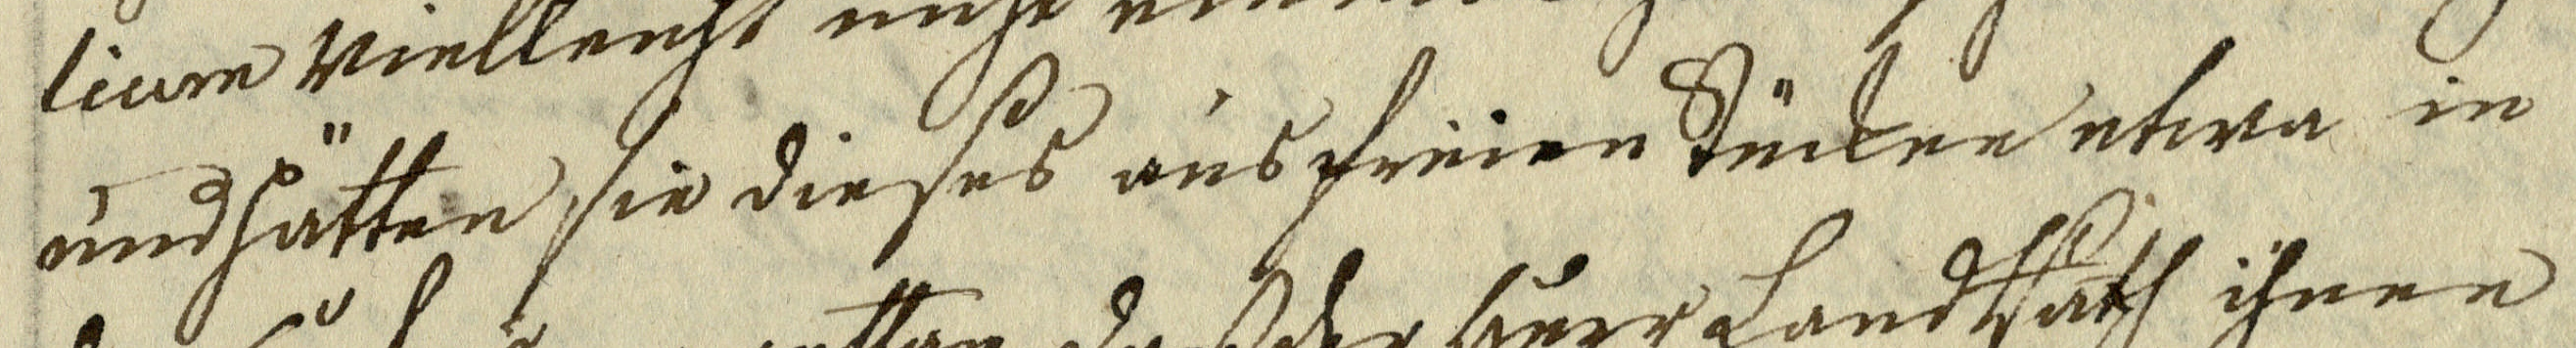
und hätten sie dieses aus freien Stücken etwa in
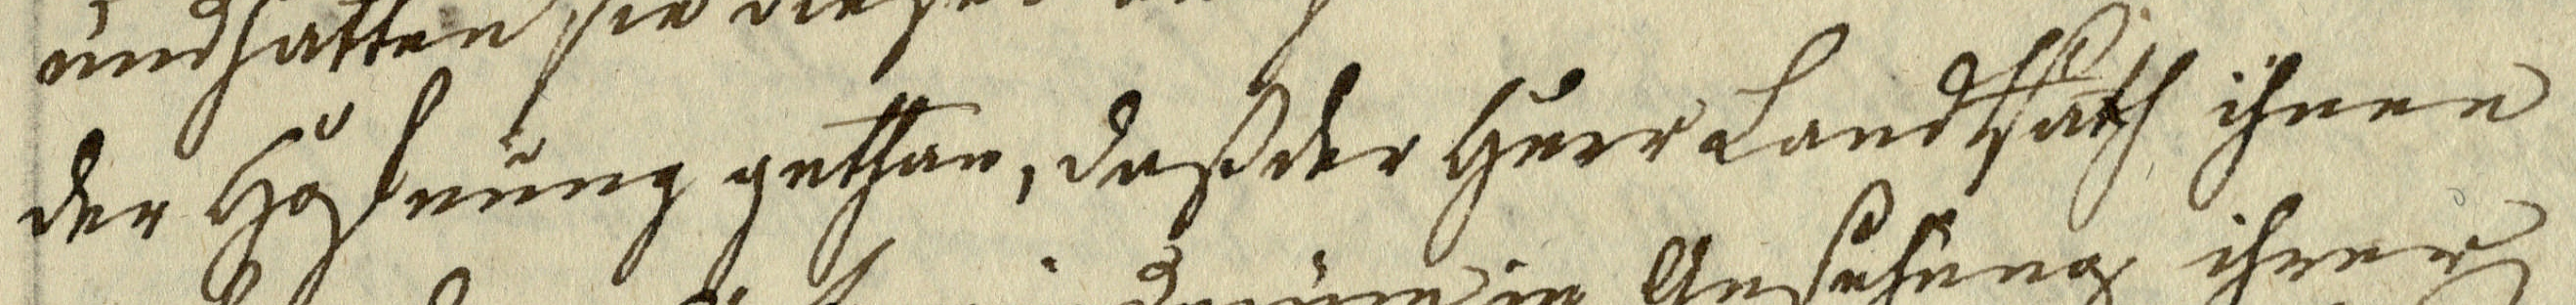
der Hofnung gethan, daß der Herr LandRath ihnen
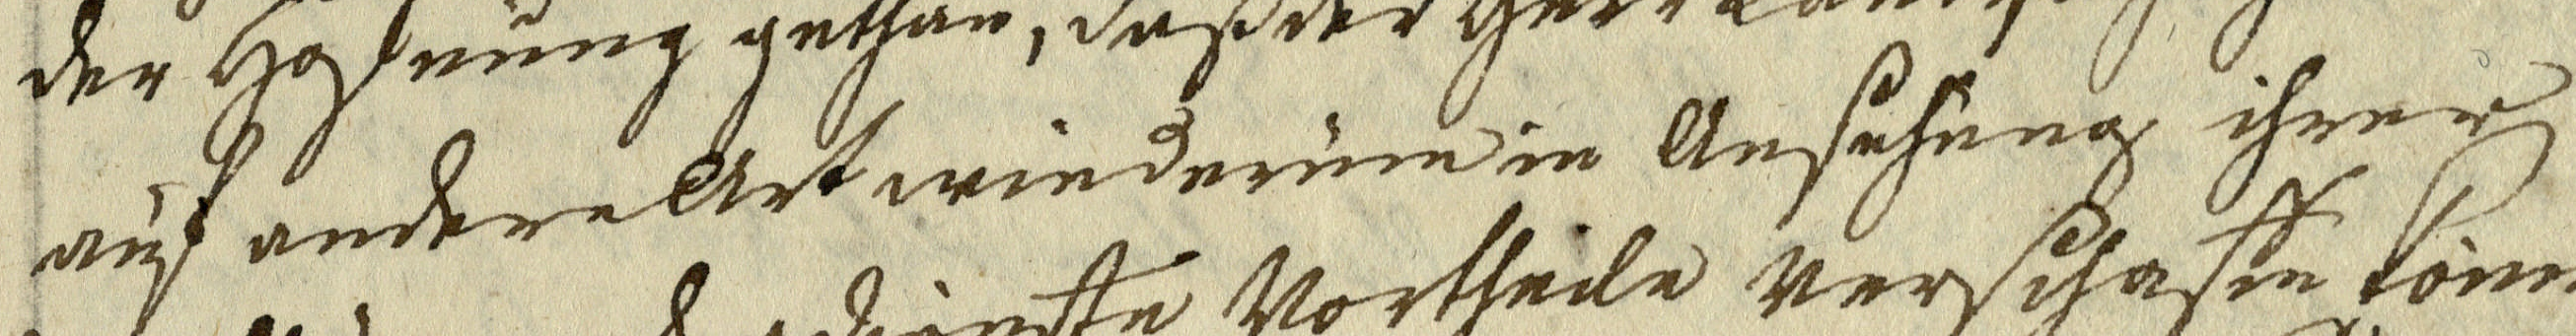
auf andere Art wiederum in Ansehung ihrer
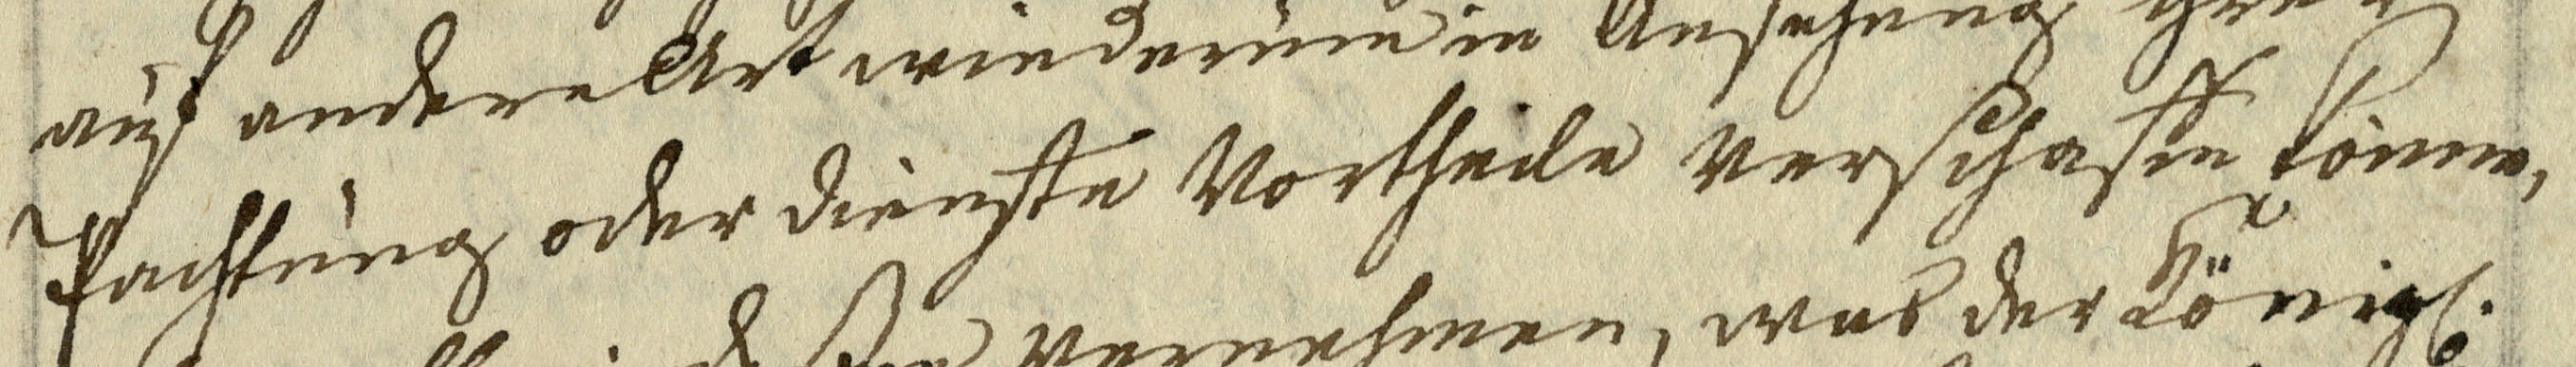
Pachtung oder Dienste Vortheile verschaffen könne,
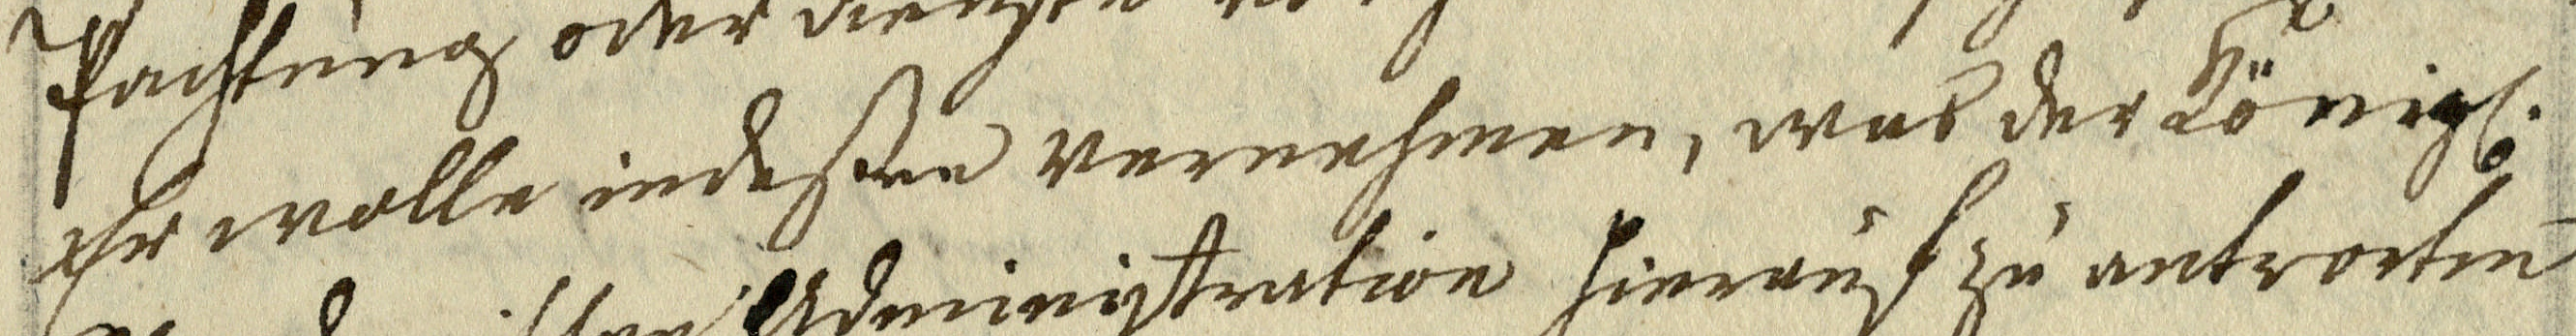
Er wolle indessen vernehmen, was der Königl.
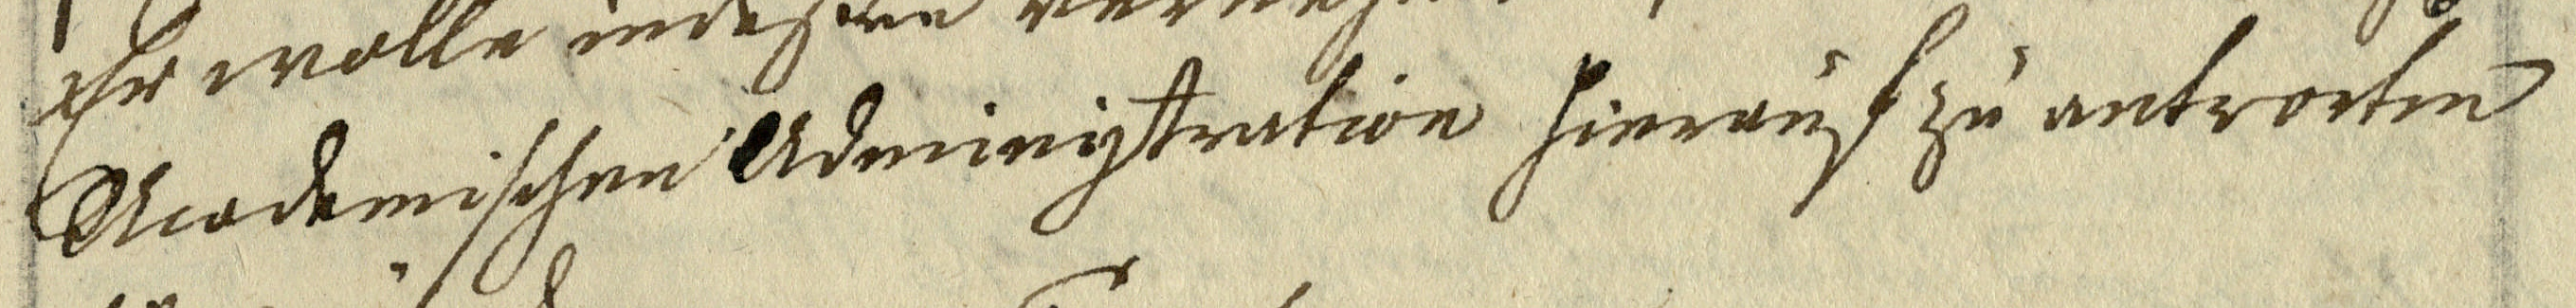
Academischen Administration hierauf zu antworten
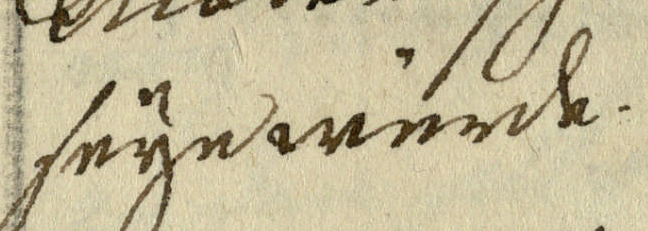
seÿn würde.
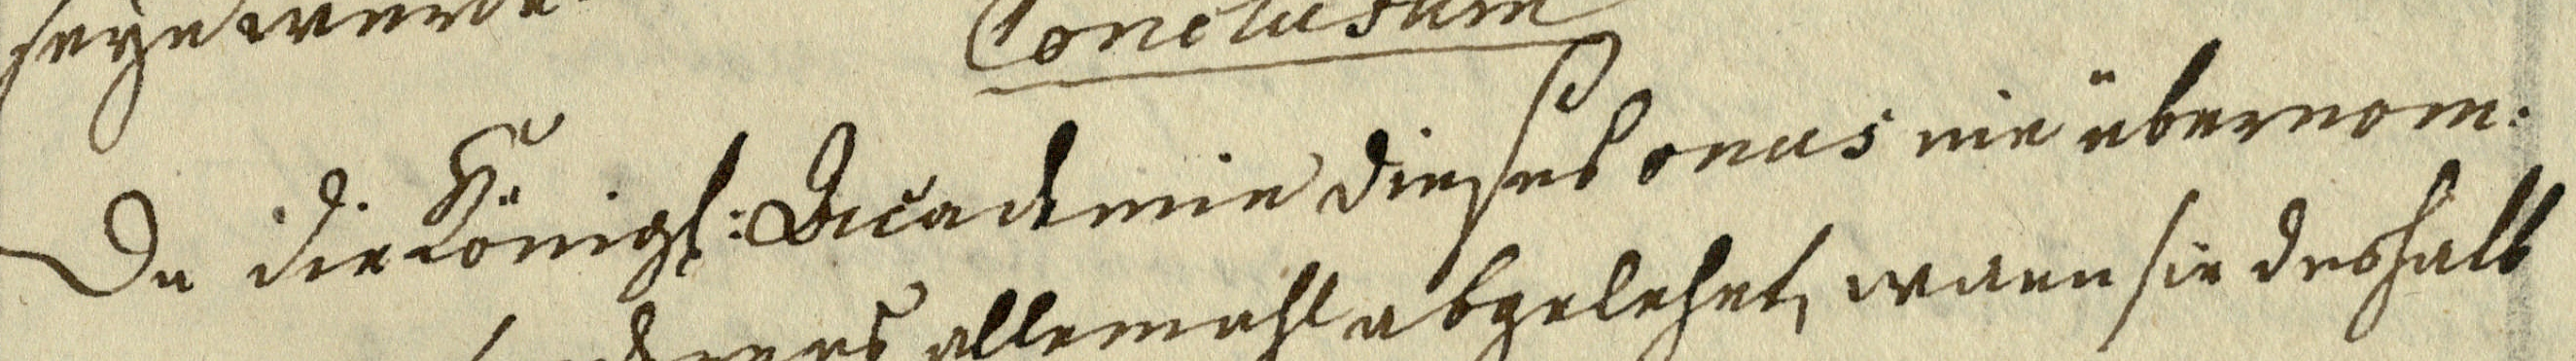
Da die Königl. Academie dieses onus nie übernom¬
